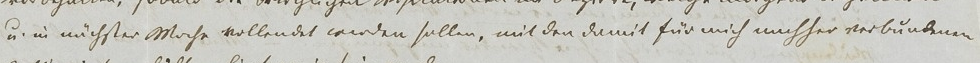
u. in nächster Woche vollendet werden sollen, mit den damit für mich nachher verbundenen
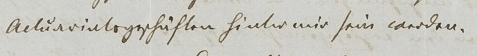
Actuariatsgeschäften hinter mir sein werden.
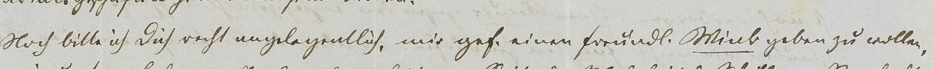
Noch bitte ich Dich recht angelegentlich, mir gef. einen freundl. Wink geben zu wollen,
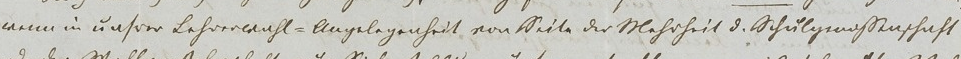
wenn in unsrer Lehrerwahl-Angelegenheit von Seite der Mehrheit d. Schulgenossenschaft
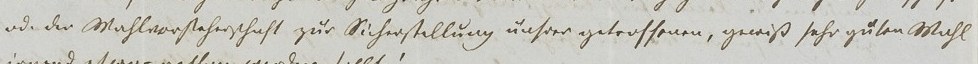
od. der Wahlvorsteherschaft zur Sicherstellung unsrer getroffenen, gewiß sehr guten Wahl
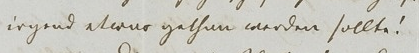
irgend etwas gethan werden sollte!
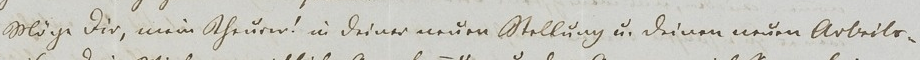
Möge Dir, mein Theurer! in Deiner neuen Stellung u. Deinen neuen Arbeits-
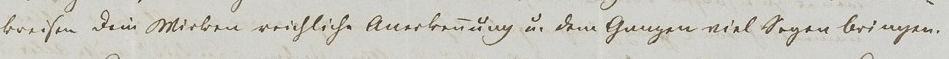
kreisen Dein Wirken reichlich Anerkennung u. dem Ganzen viel Segen bringen.
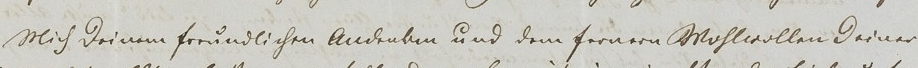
Mich Deinem freundlichen Andenken und dem fernern Wohlwollen Deiner
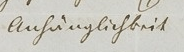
Anhänglichkeit
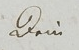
Dein
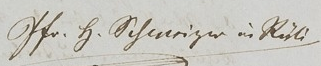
Pfr. H. Schweizer in Rüti
